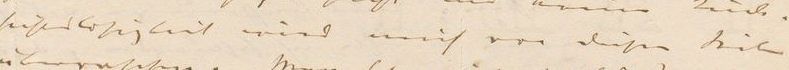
sichtslosigkeit wird mich von dieser Seite
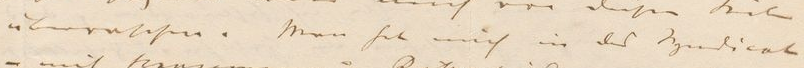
überraschen. Man hat mich in das Syndicat
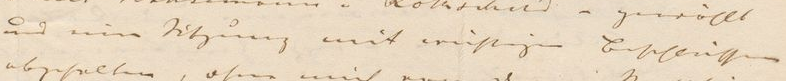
und eine Sitzung mit wichtigen Beschlüssen
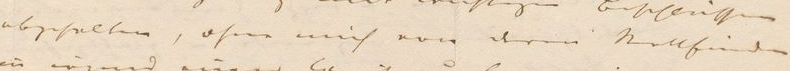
abgehalten, ohne mich von deren Stattfinden
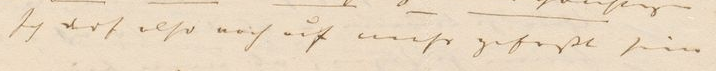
Ich darf also noch auf mehr gefaßt sein.
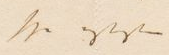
Ihr ergbster
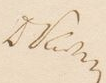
L Parcus
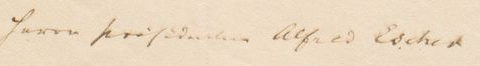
Herrn Präsidenten Alfred Escher
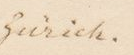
Zürich.
